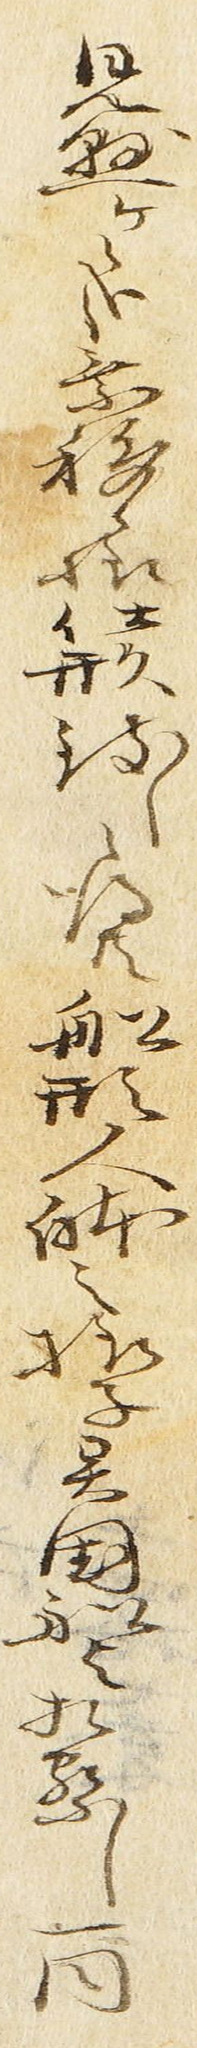見懸ケ候哉乗移候様仕形致し候得船形人躰之様子吾国船と相異し一同
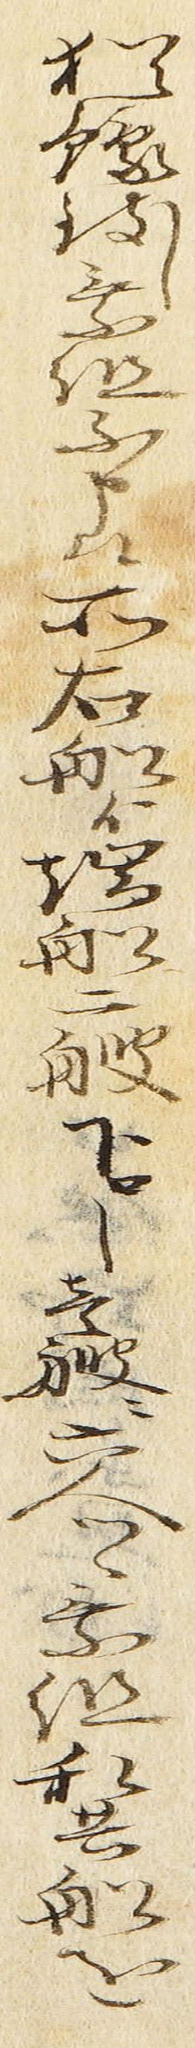猶？致し乗組不申候処右船ゟ端船二艘下ロし壱艘に六人つつ乗組私共船を
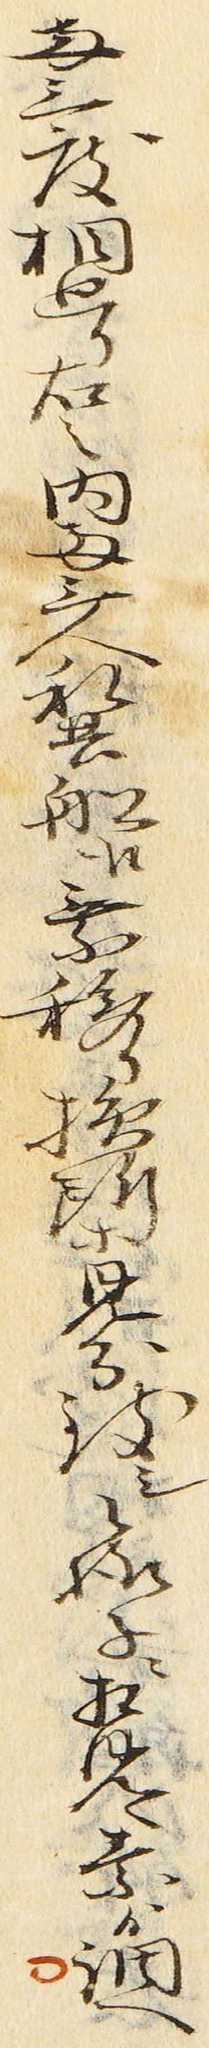両三度相廻り右之内両三人私共船江乗移り損所等見分致し候様子に相見へ素ゟ調へ
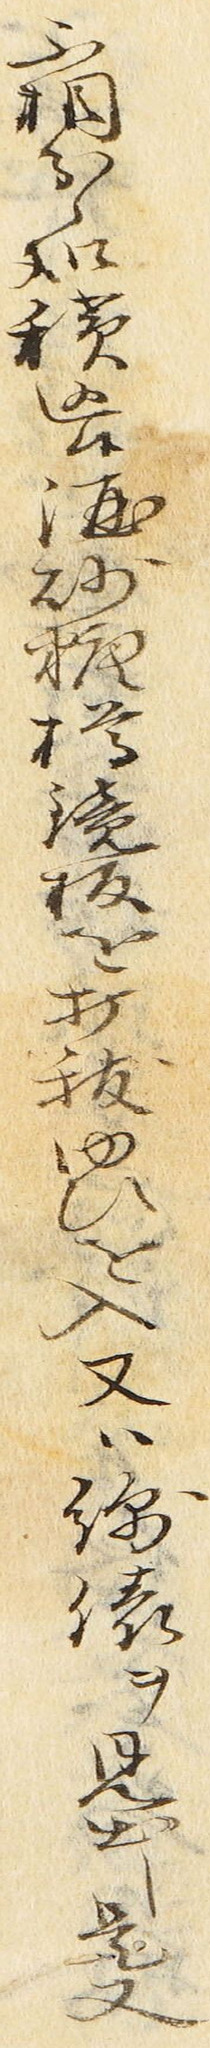不相分候処積込候酒砂糖樽鏡板を打抜ゆひを入又は綿俵ヲ見出し是又
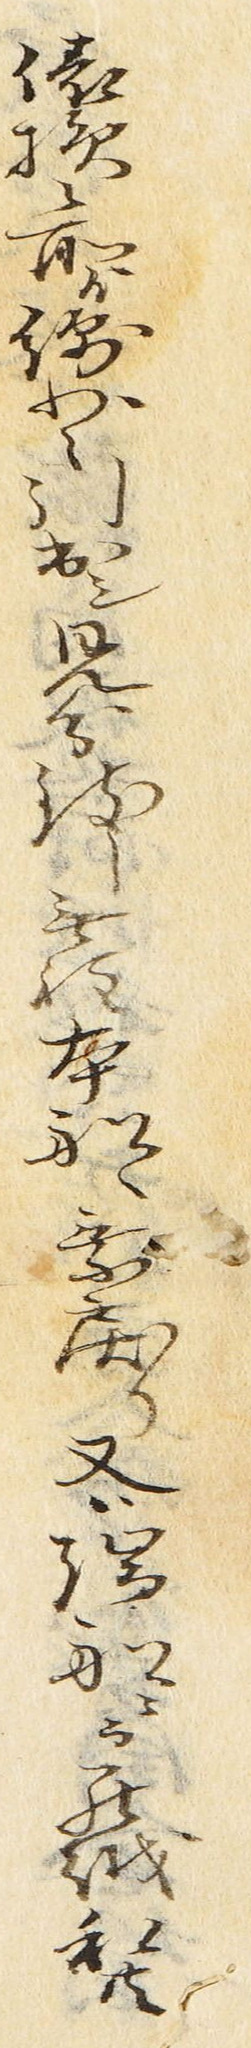俵損之所ゟ綿少々引出し見分致し無程本船へ乗戻り又は端船に而
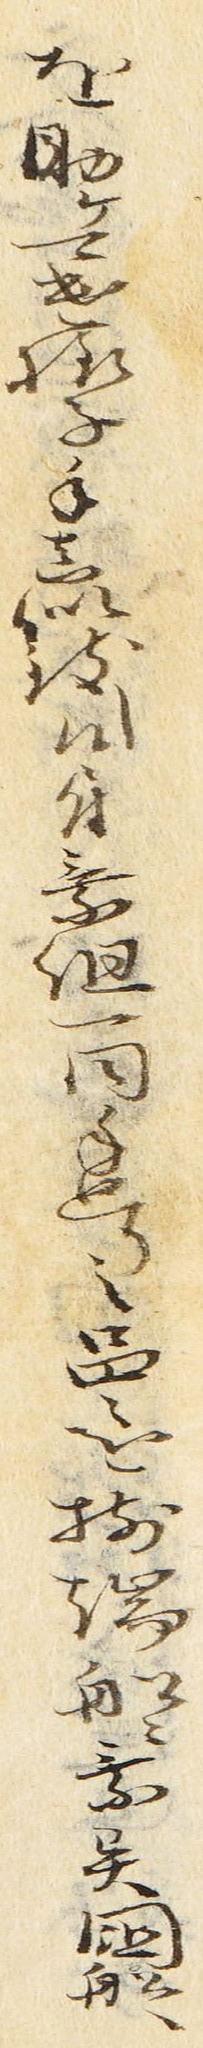を助けて遣様子手真似致し候に付乗組一同手廻り品々を持端船に乗異国船へ
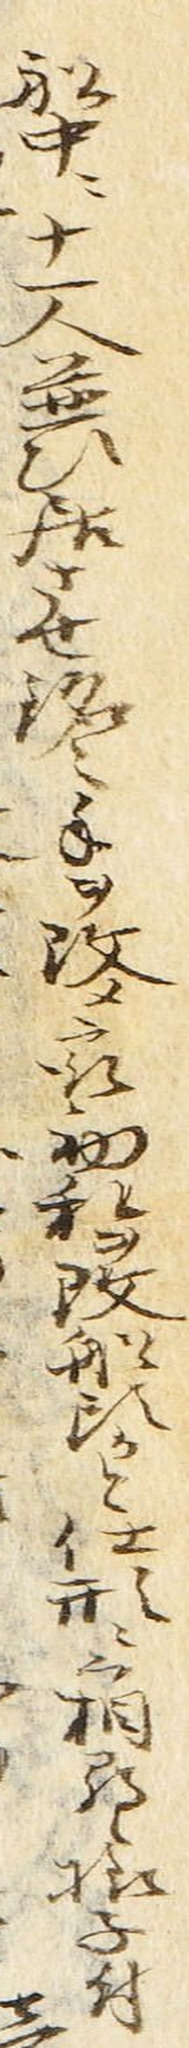船中に十一人並ひ居させ銘銘手ヲ改め而取候初私ヲ改船頭かと仕形に而相尋候様子付
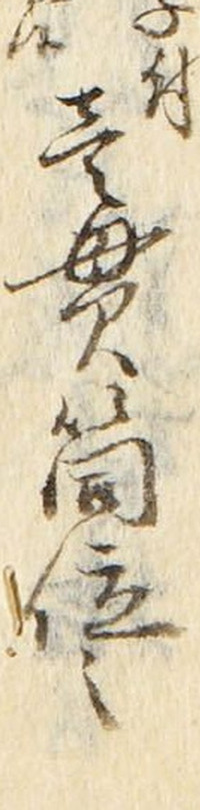壱貫筒位之
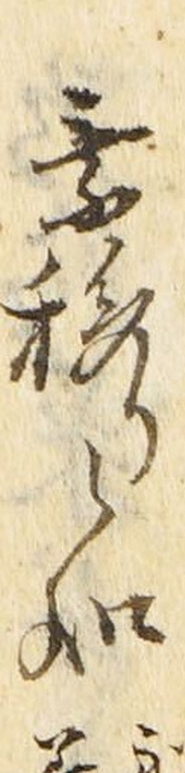乗移り候処
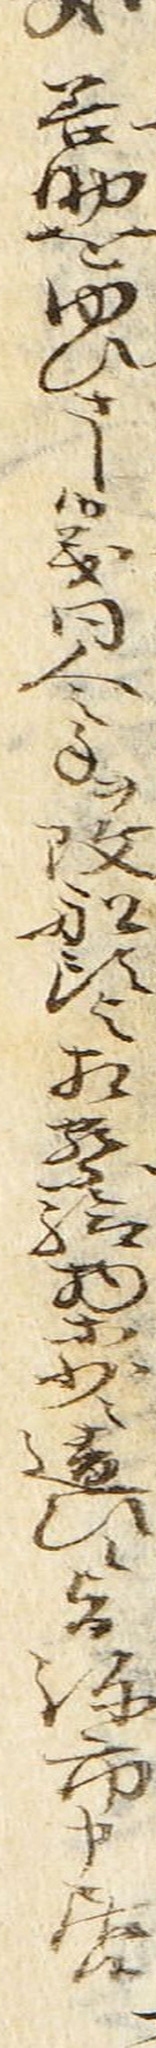善助をゆひさし候義同人之手ヲ改船頭と相？給物等少々違ひ候旨弥市申居候
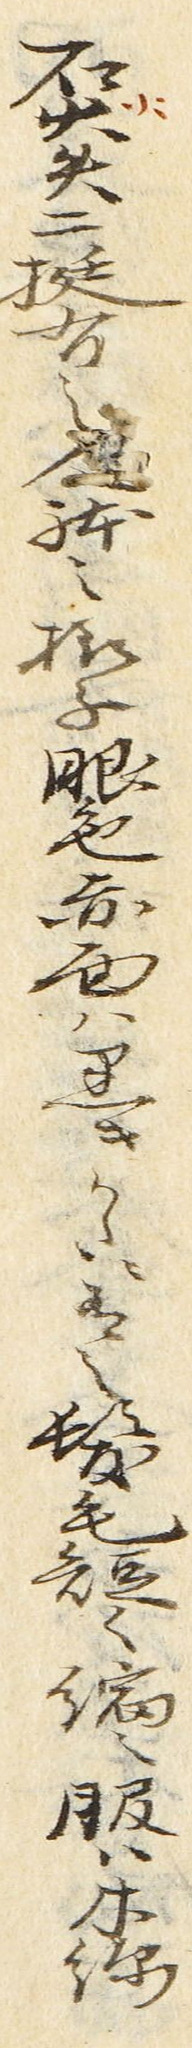石火矢二挺有之壁躰之様子眼色赤面は黒きかたに有之髪毛短く縮之
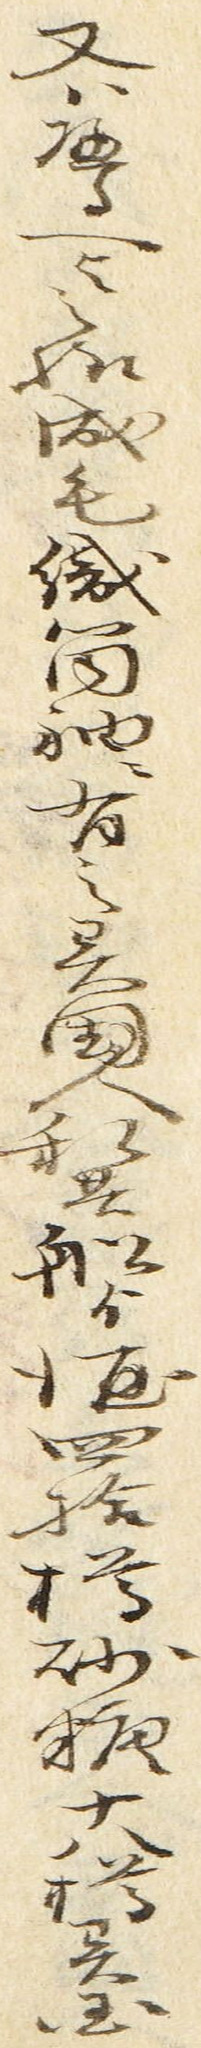又は遍るへと之様成る毛織筒袖に有之異国人私共船ゟ酒四拾たる砂糖十八樽異国
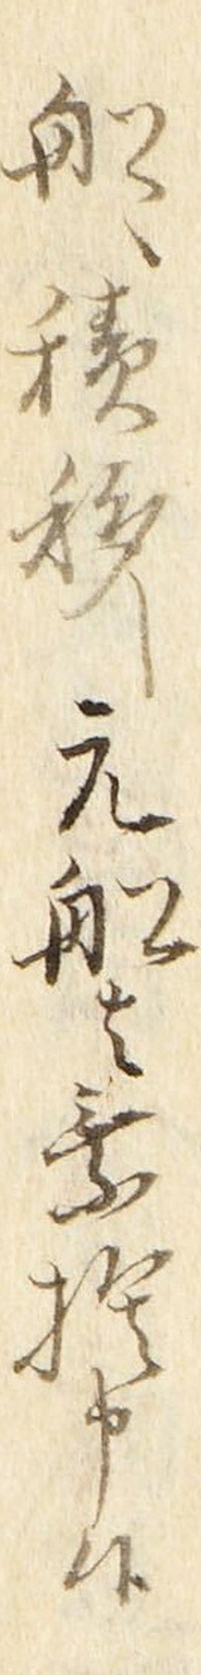船へ積移し元船は乗捨申候

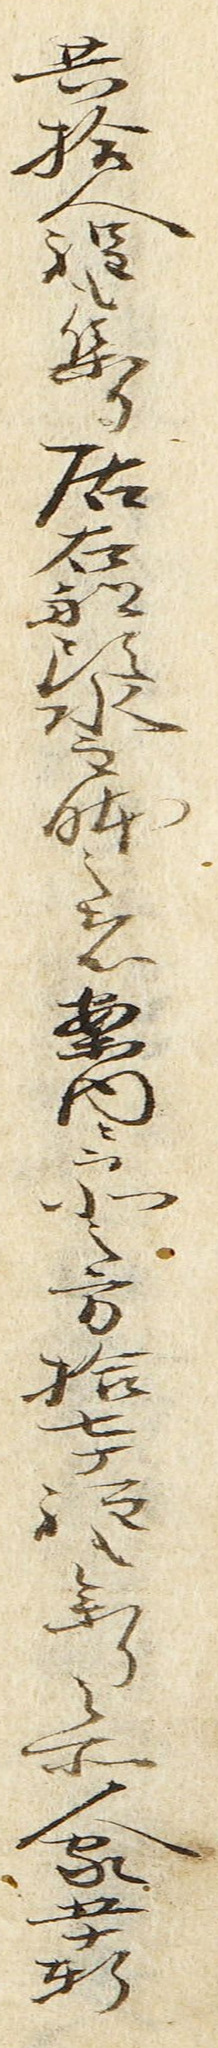共十人程も集り居右船頭水主躰之者案内に而北之方拾七丁程も参り之所人家五十軒
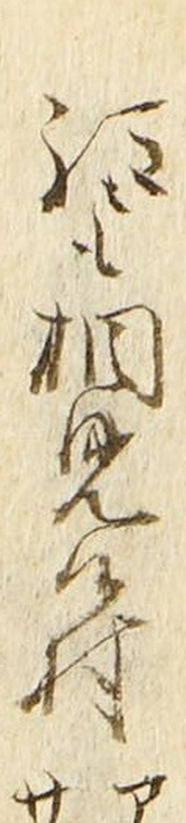程にも相見候村
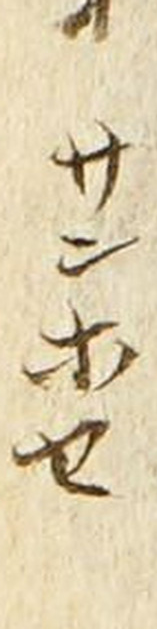サンㇹセ
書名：長崎漂流記
